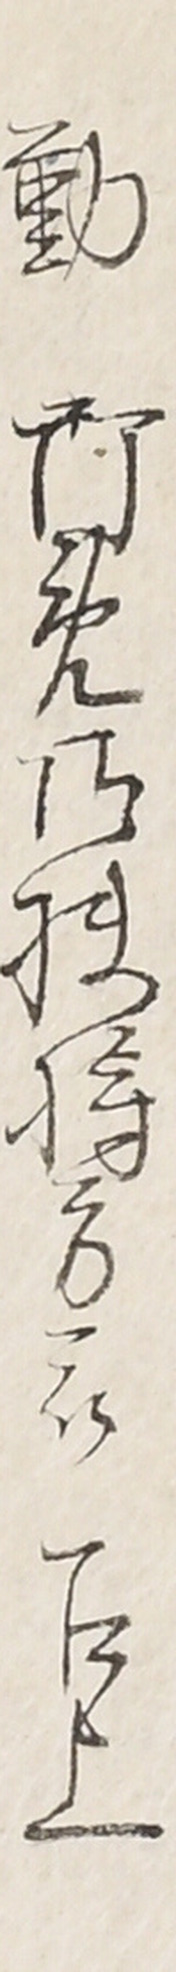勤御免御扶持方被召上
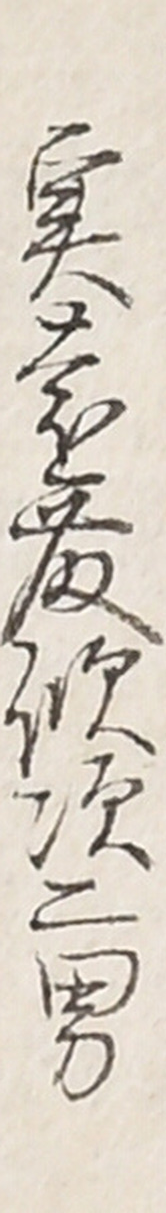実遠藤欣次二男
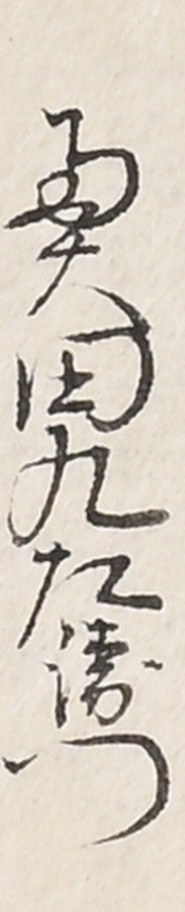奥田九左衛門
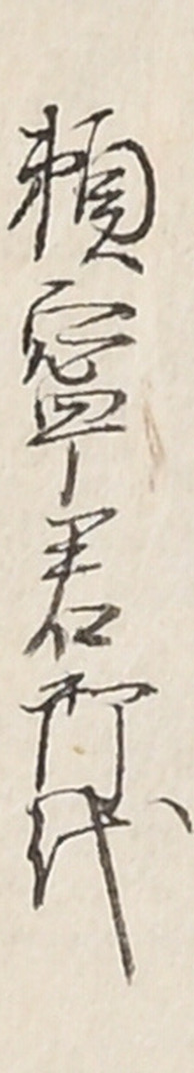頼寧君御代
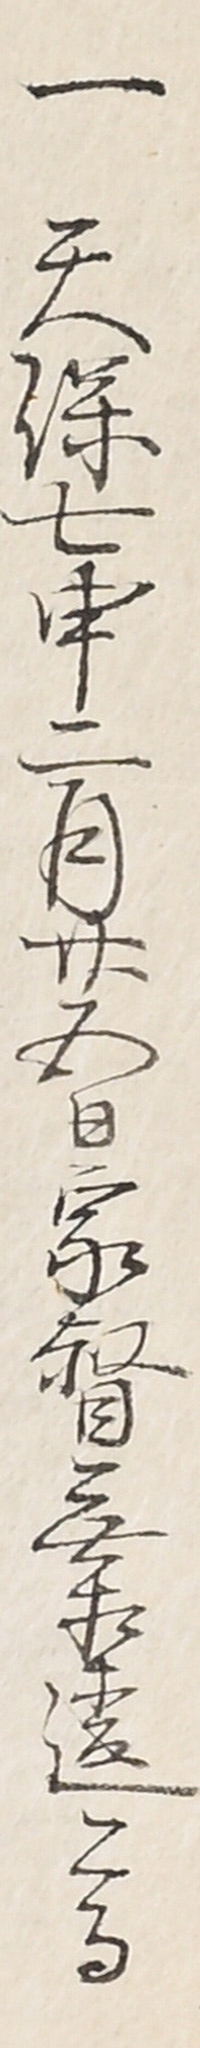一天保七申二月廿五日家督無相違高
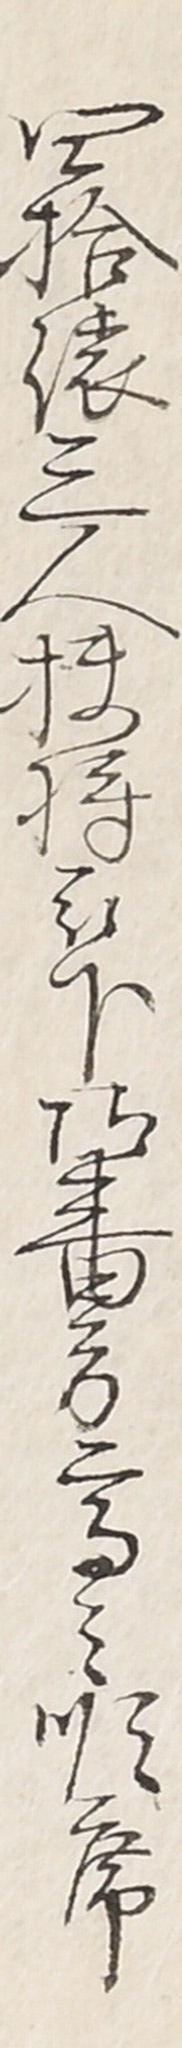四拾俵三人扶持被下御番方高之順席
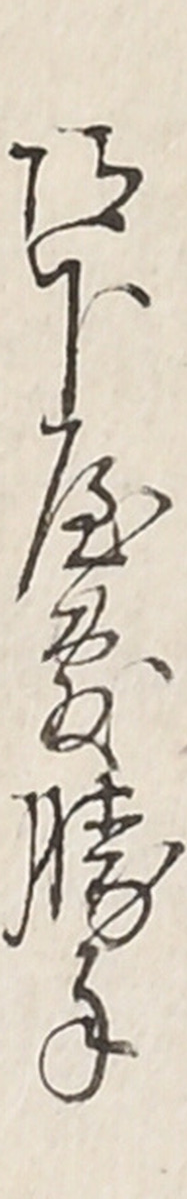御下屋敷勝手
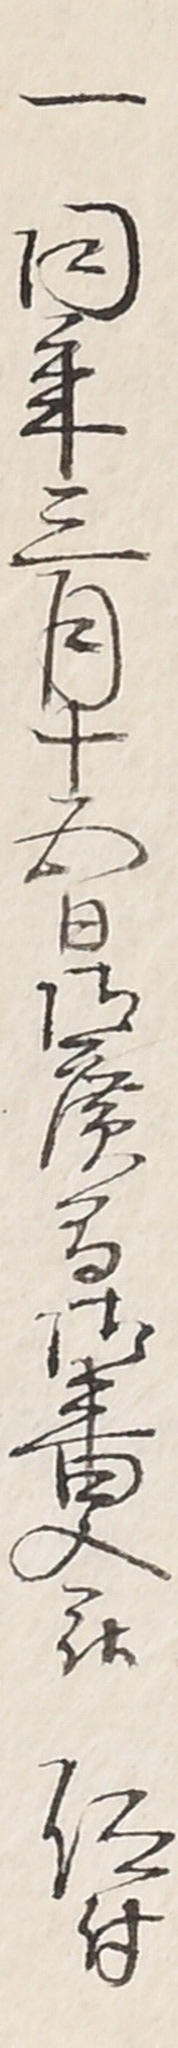一同年三月十五日御広間御番人被仰付
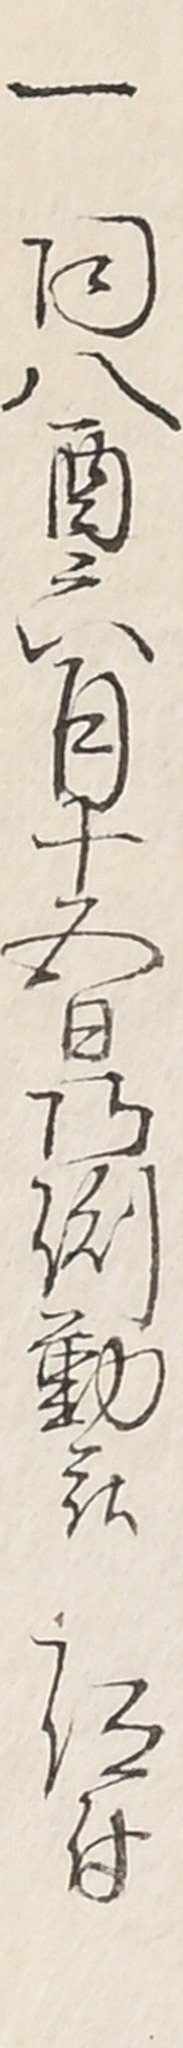一同八酉六月十五日御側勤被仰付
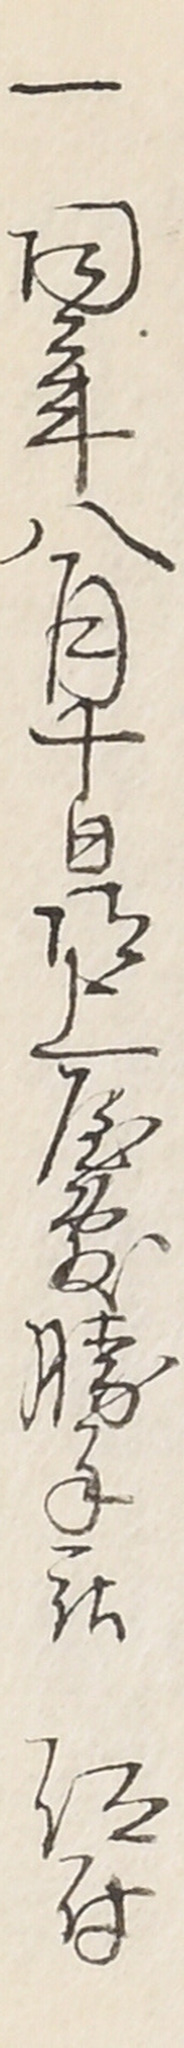一同年八月十日御上屋敷勝手被仰付
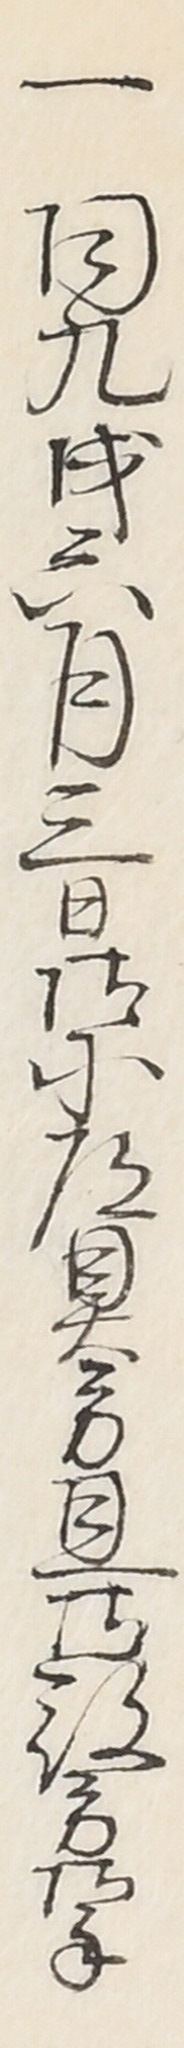一同九戌六月三日御小道具方且御役方御手
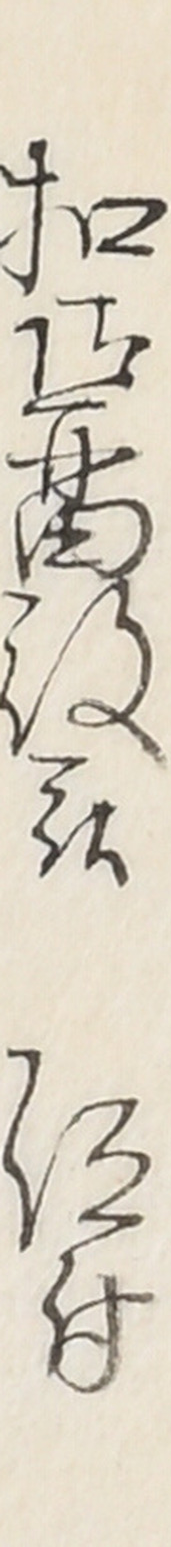控御留役被仰付
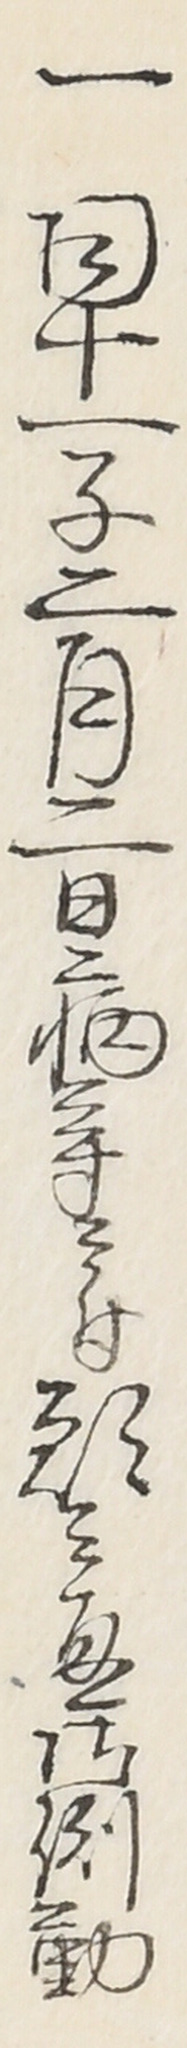一同十一子二月二日病気ニ付願之通御側勤
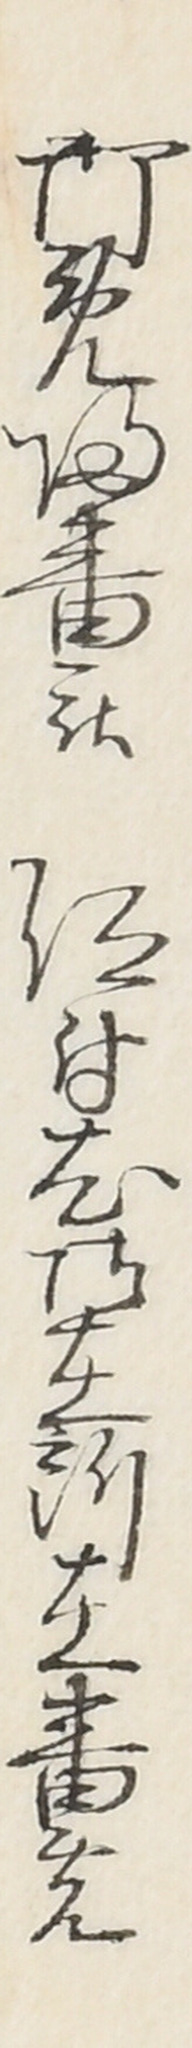御免帰番被仰付尤御在所在番先
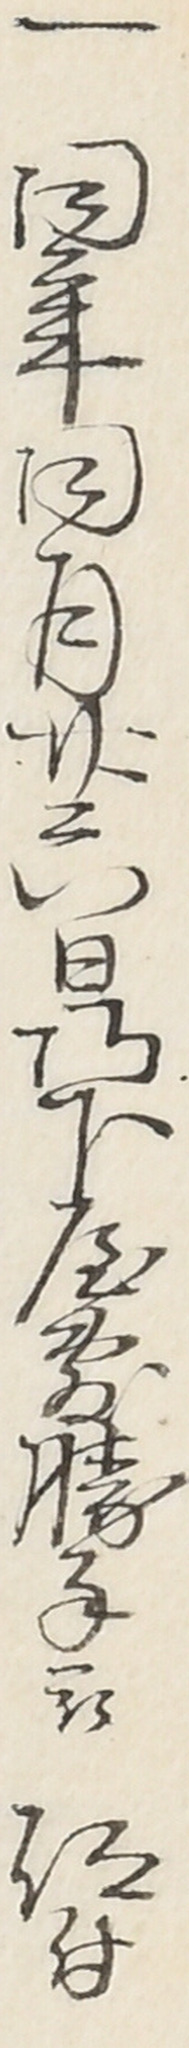一同年同月廿六日御下屋敷勝手被仰付
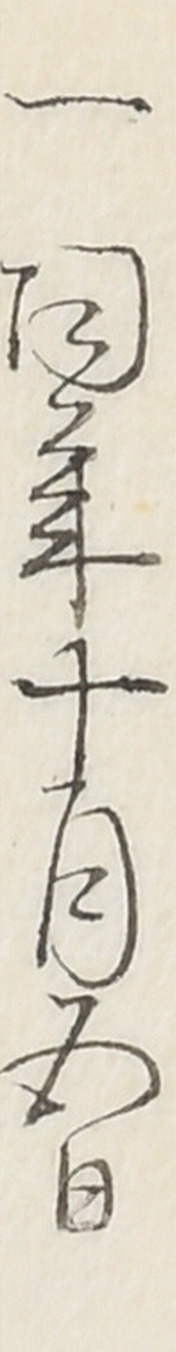一同年十月五日
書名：給人諸士勤仕録（七）
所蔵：伊那市立高遠町図書館・合同会社AMANE
